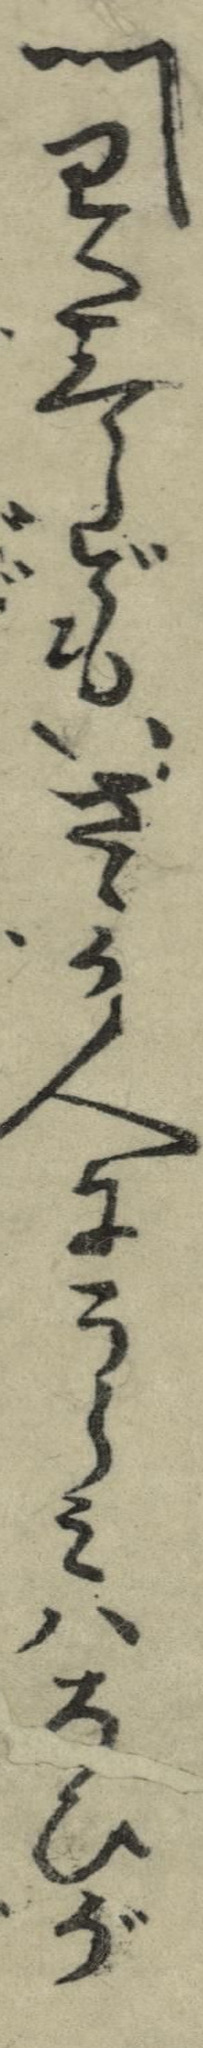〽わたくしどもいさゝか人にうらみはなひが
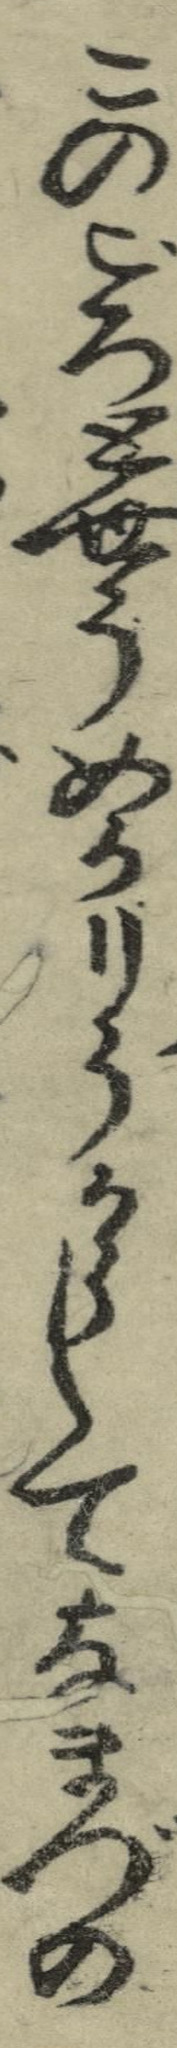このごろどぜうめがりうかうしてなまづの
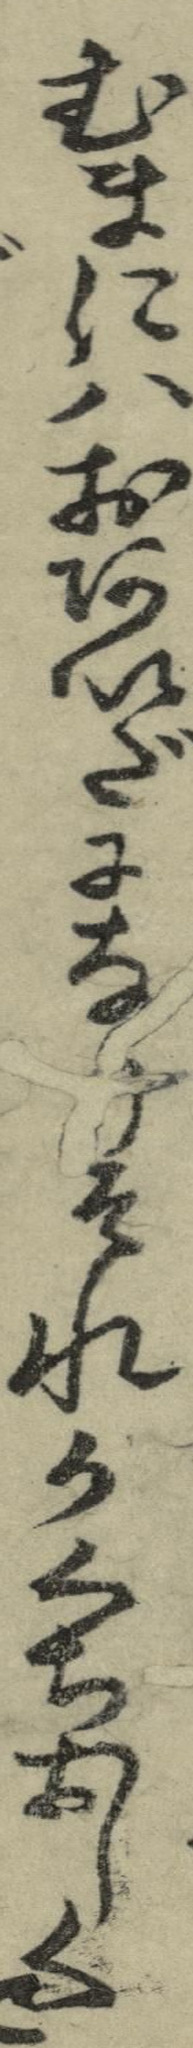むまにはおあいだになりそれかくちおしくて
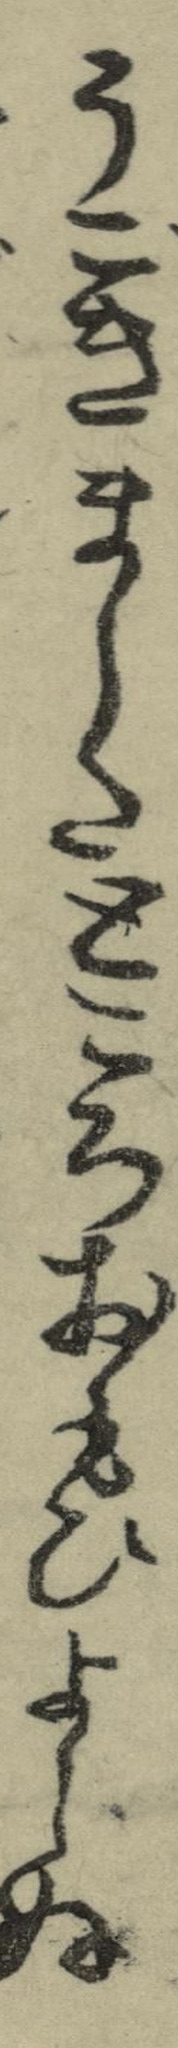うごきましたところおもひよらぬ
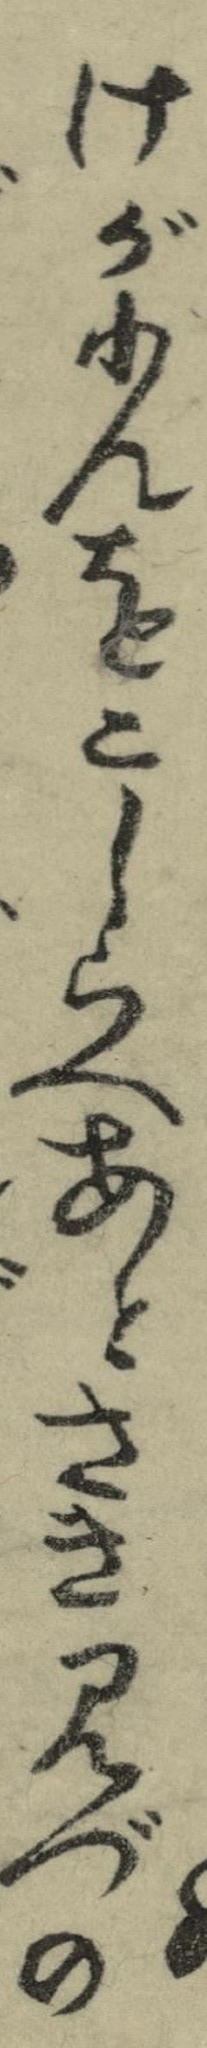けがにんをこしらへあとさき見づの
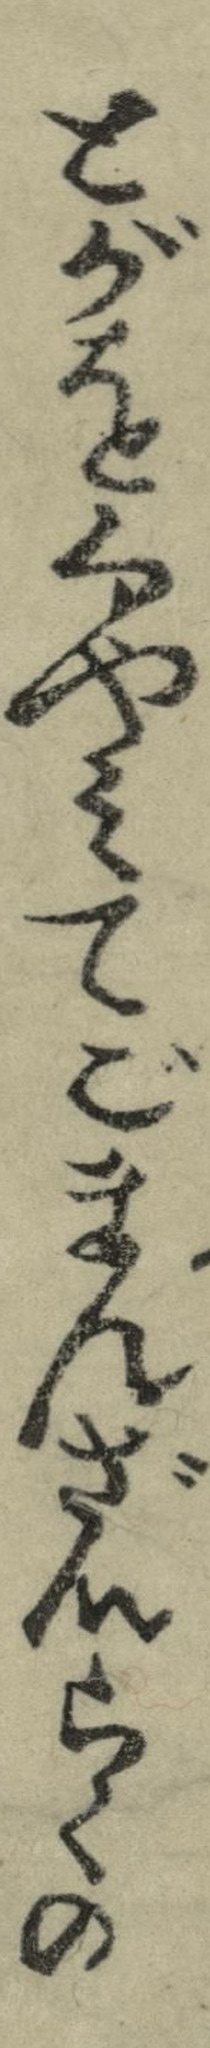とがをくやみてごまんざいらくの
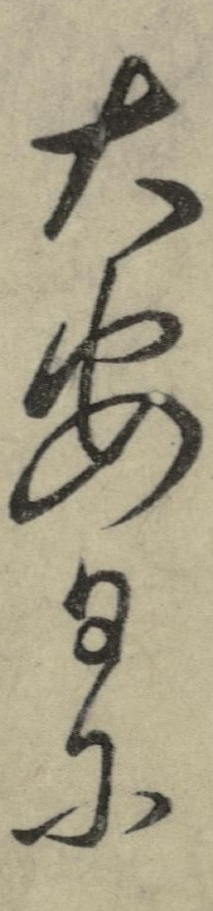大安日に
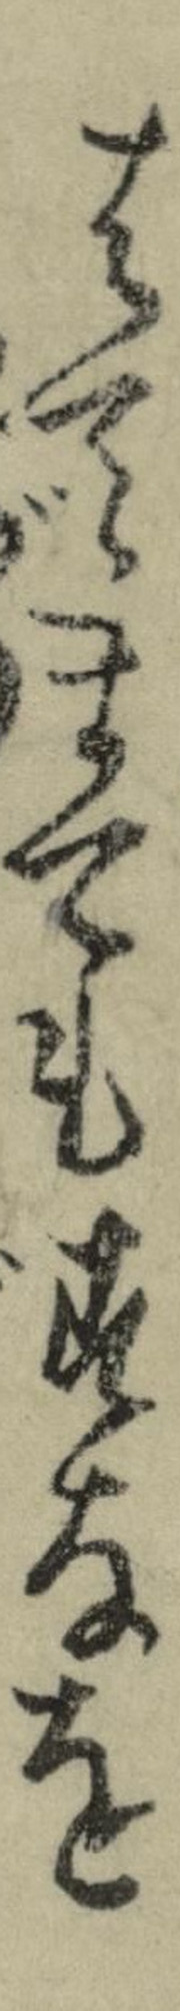はてまてもすなを
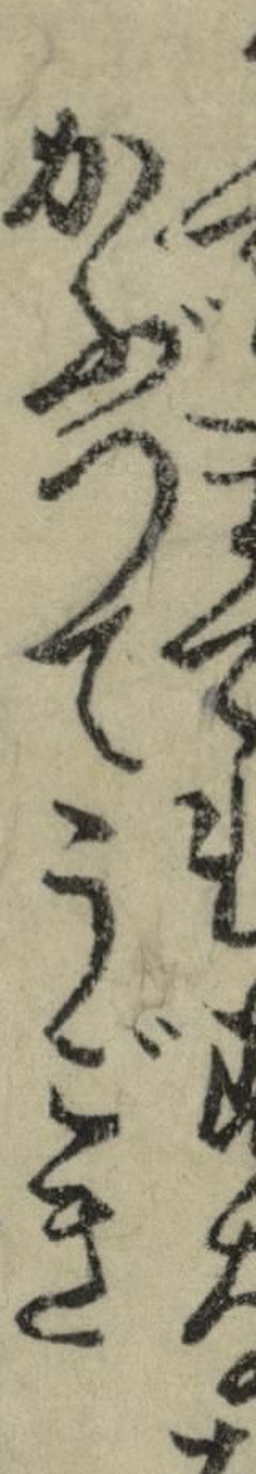かぶつてうごき
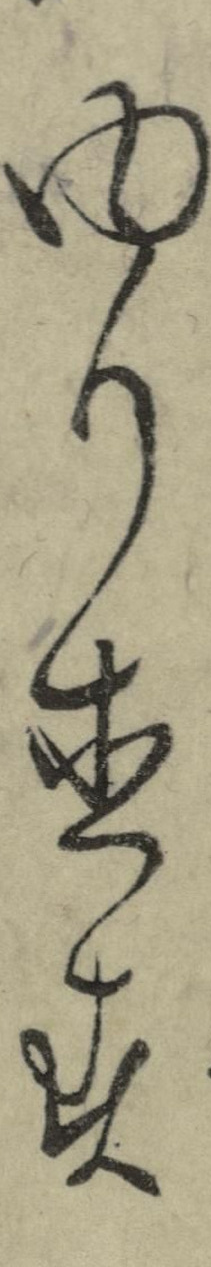ゆり直す
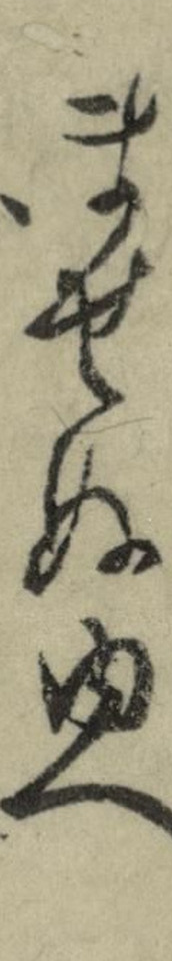ませぬゆへ
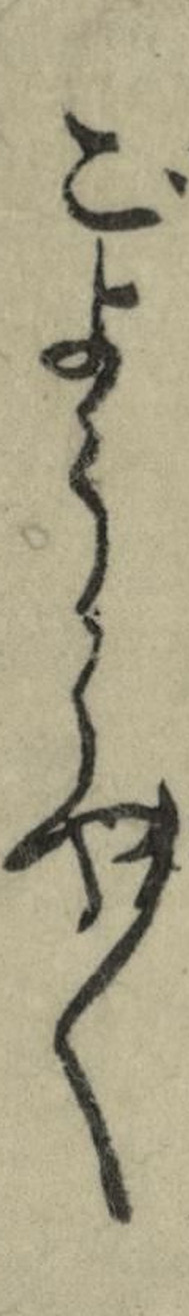ごようしや〳〵
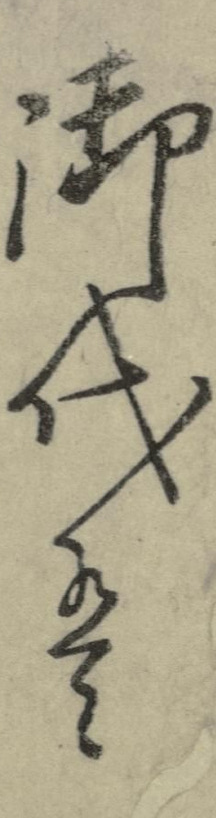御代は
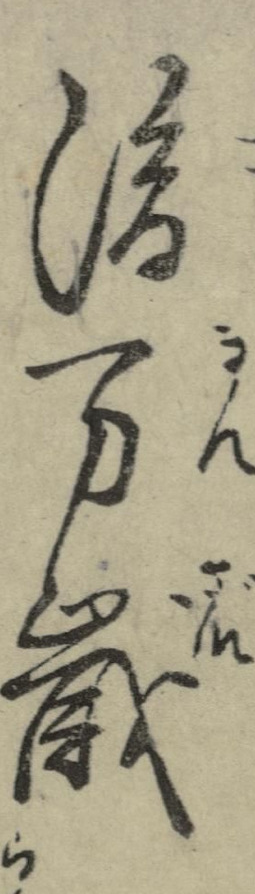後万歳
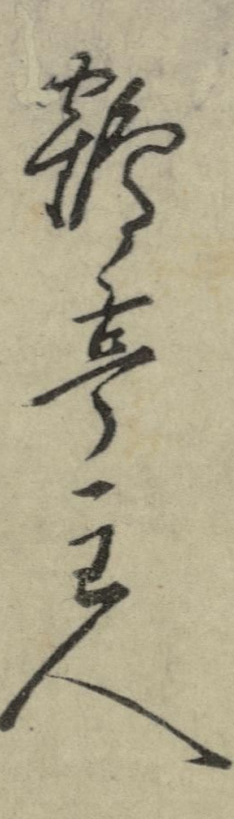鶴亭主人
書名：[あら嬉し大安日にゆり直す]
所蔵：東京大学地震研究所図書室 Earthquake Research Institute Library, The University of Tokyo, JAPAN
